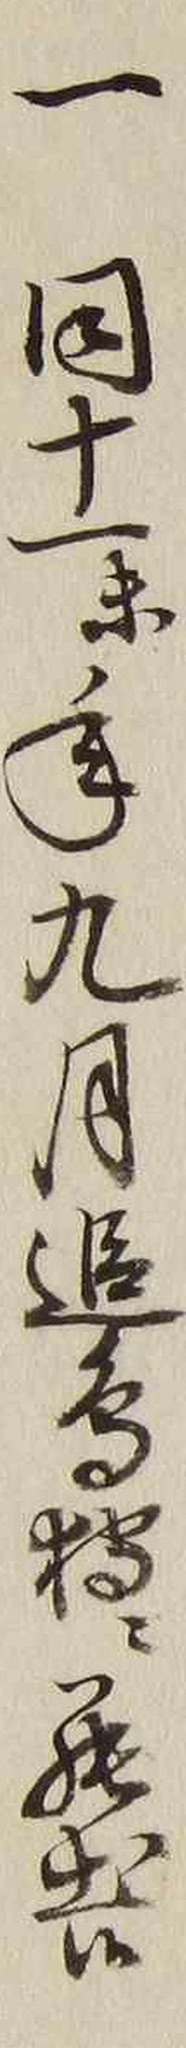一同十一未年九月追鳥狩ニ罷出候
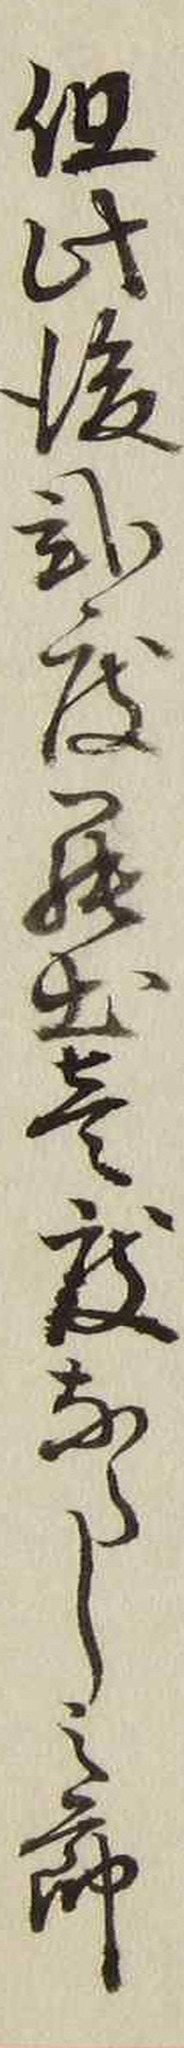但此後弐度罷出壱度ならし之節

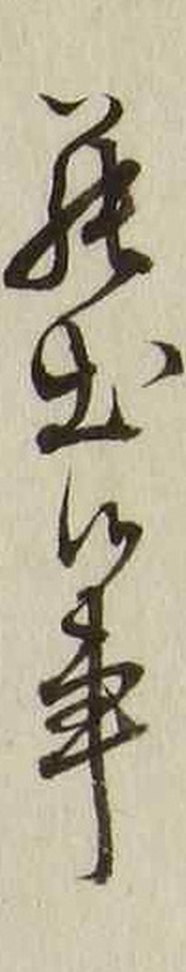罷出候事
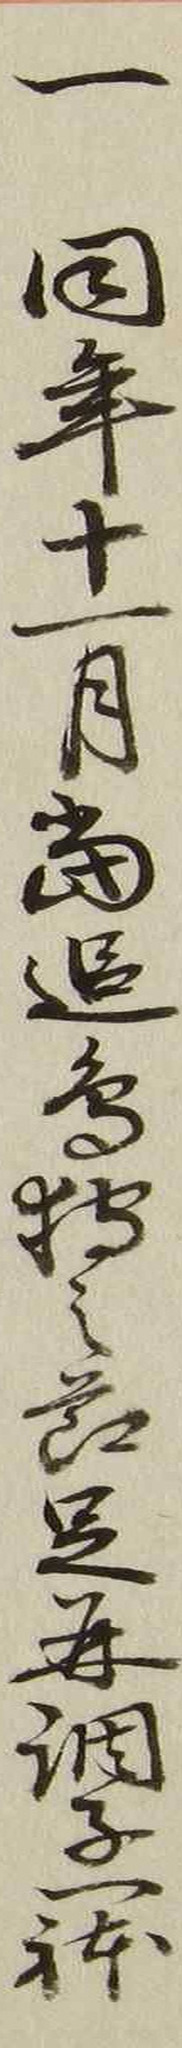一同年十一月当追鳥狩之節足并調子一体
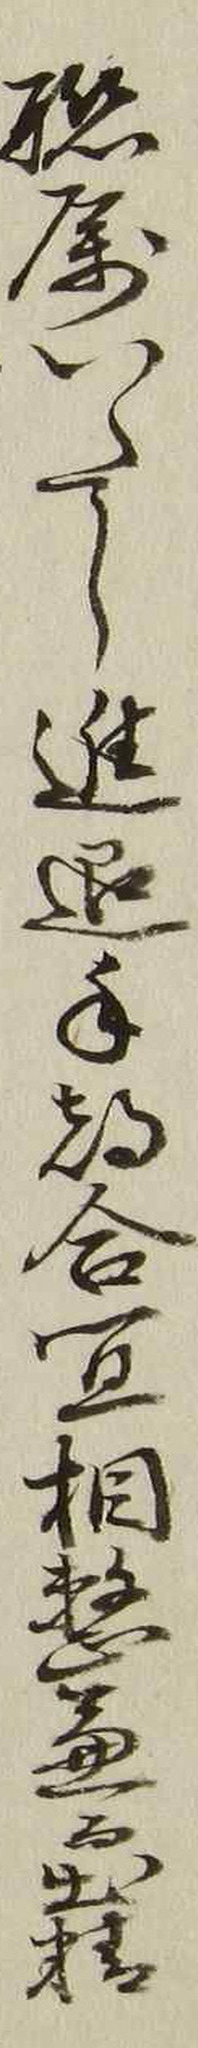聯属いたし進退手都合宜相整兼而出精
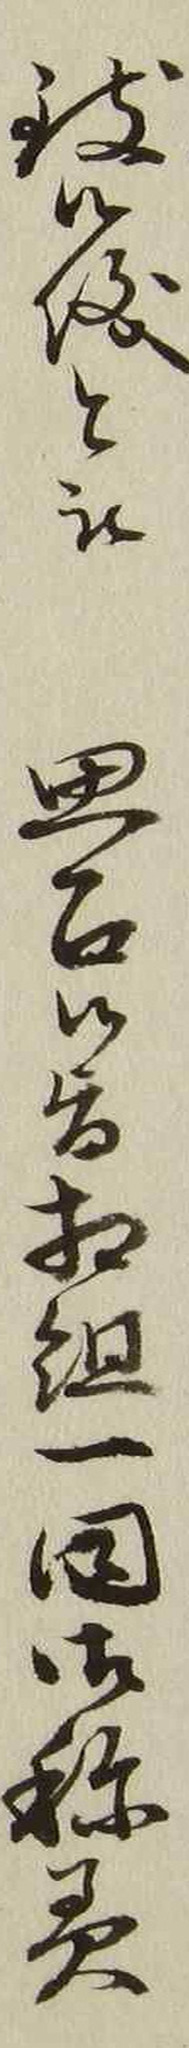致候儀と被思召候旨相組一同御称美
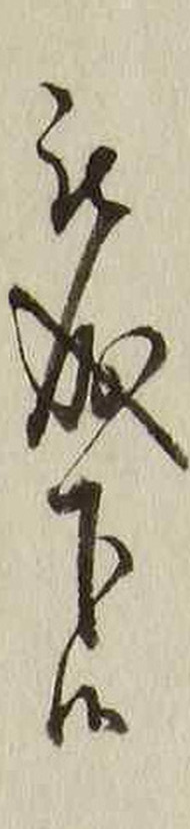被成下候
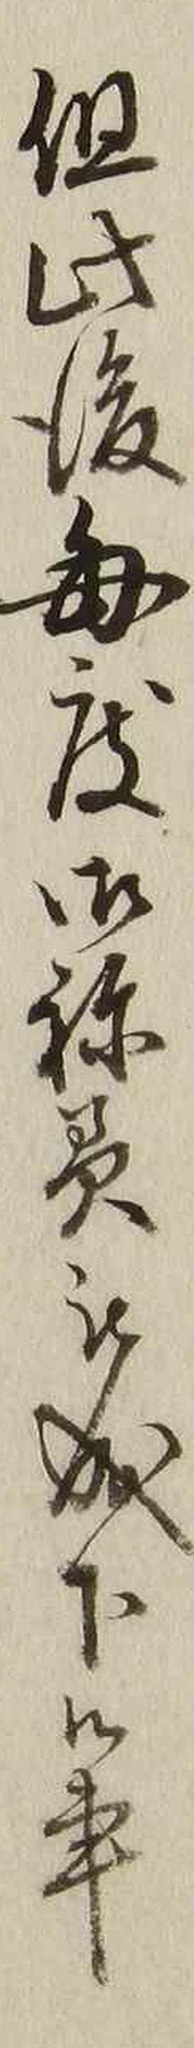但此後毎度御称美被成下候事
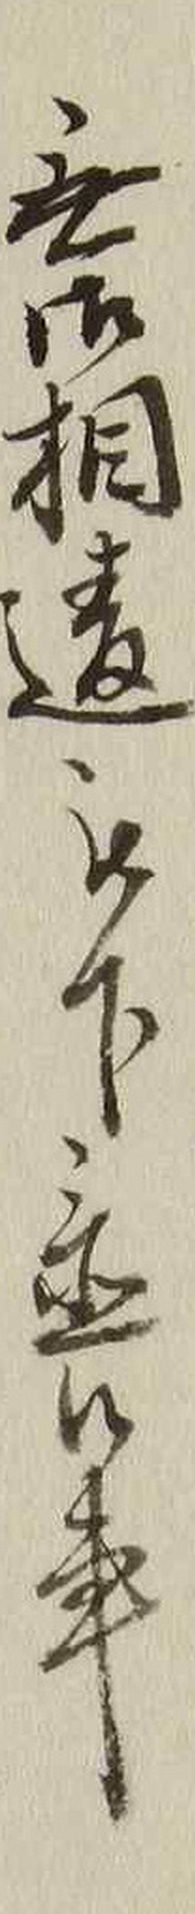無御相違被下置候事
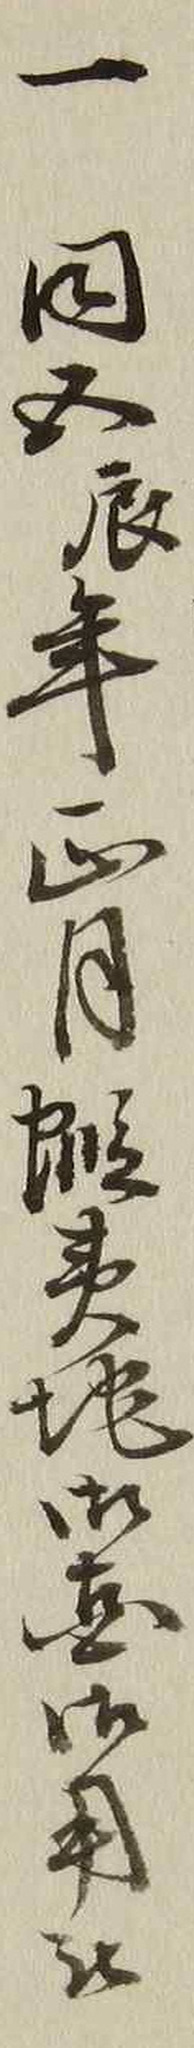一同五辰年正月蝦夷地御固御用被
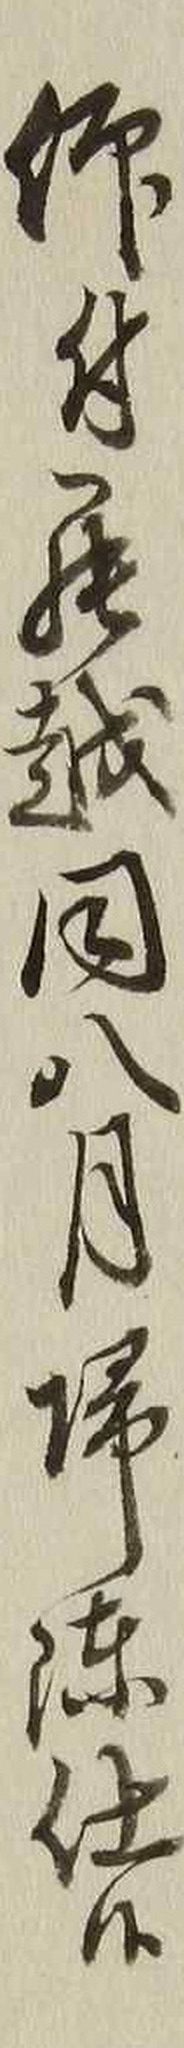仰付罷越同八月帰陣仕候
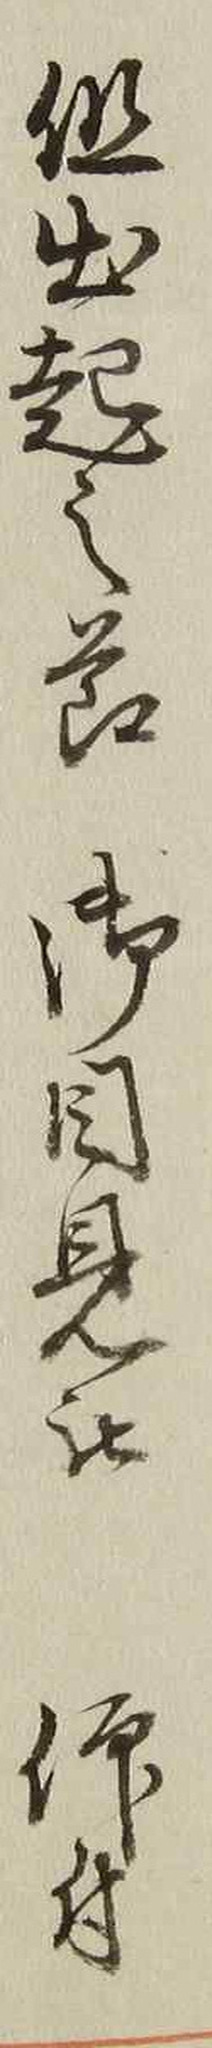但出起之節御目見被仰付
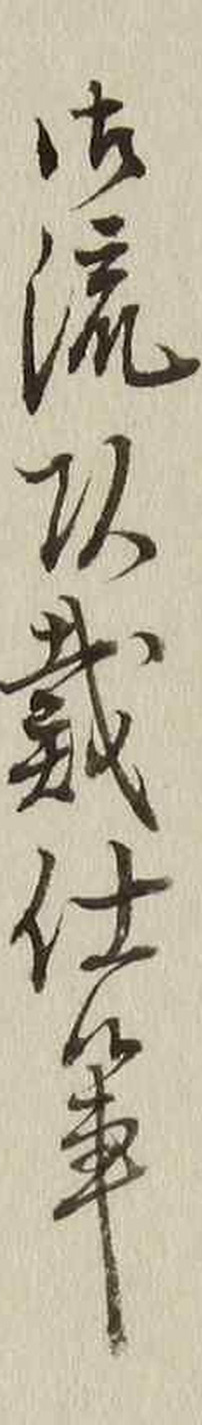御流頂戴仕候事
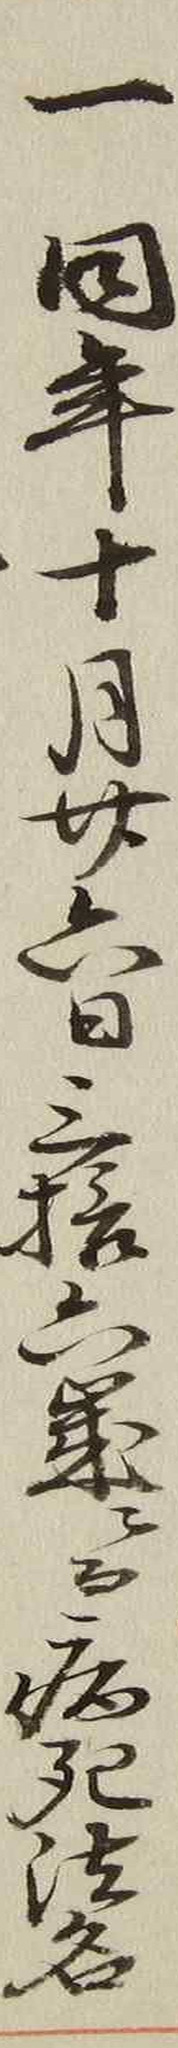一同年十月廿六日三拾六歳ニ而病死法名
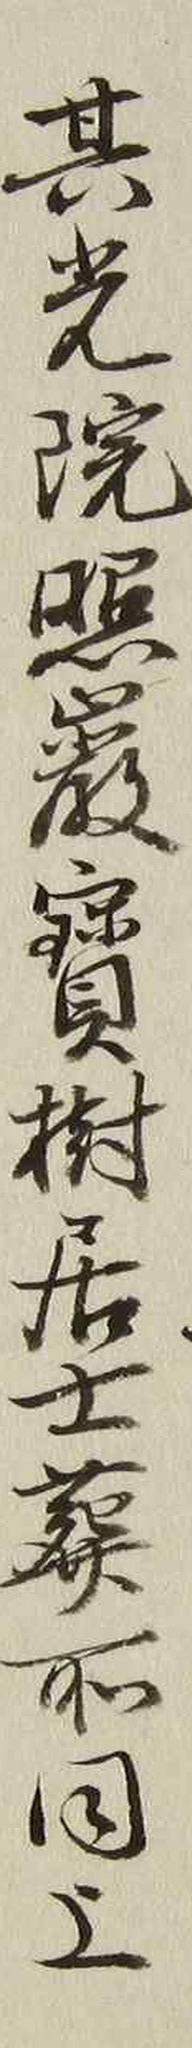其光院照巌宝樹居士葬所同上
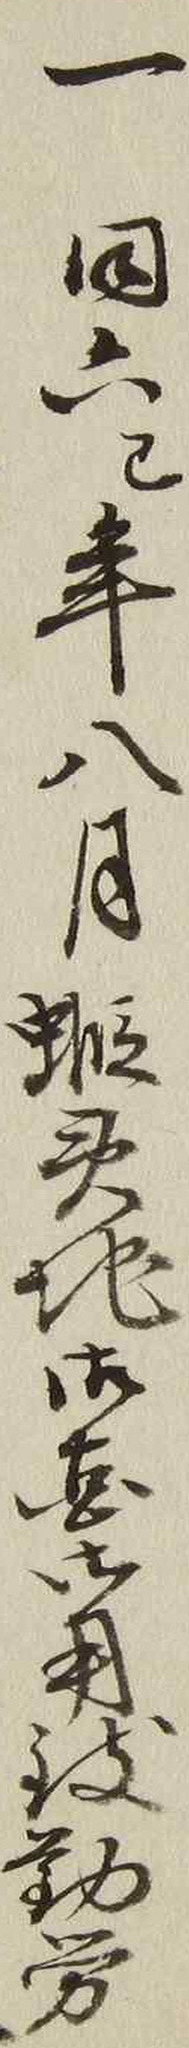一同六巳年八月蝦夷地御固御用致勤労
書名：諸士系譜　巻之27　い之部27
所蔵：会津若松市立会津図書館
